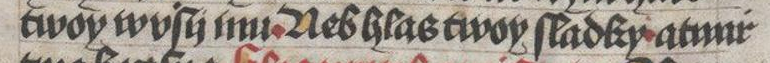twoy wuẛij mu.Neb hlas twoy ſladký a twaṙ
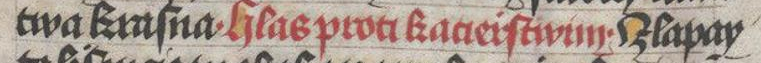twa kraſna.Hlas proti kacieṙſtwím.Zlapay
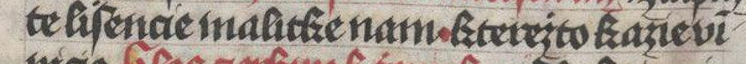te liẛencie malitke nam.ktereżto kazie vī¬
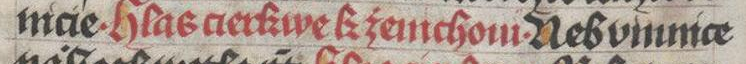nicie.Hlas cíerkwe k ženichoui.Neb vinnice
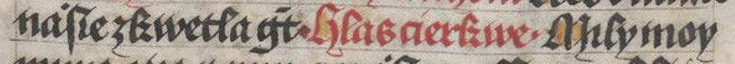naẛie zkwetla ḡt.Hlas cíerkwe.Mily moy
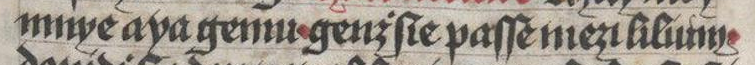mnye a ya gemu.genż ſie paſſe mezi lilium.
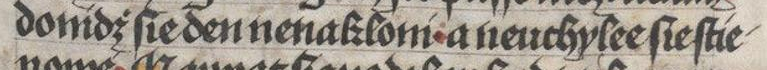donidż ſie den nenakloní. a neuchylee ſieſtie¬
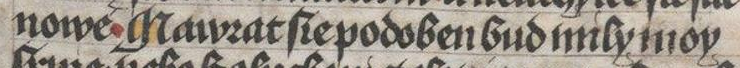nowé.Nawrat ſie podoben bud mily moy
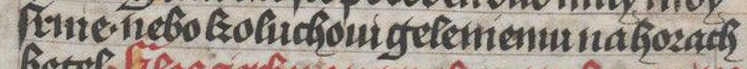ſrnie.nebo koluchouí geleníemu nahorach
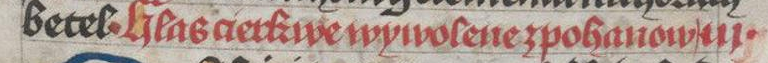betel.Hlas cíerkwe wywolene zpohanow iii.
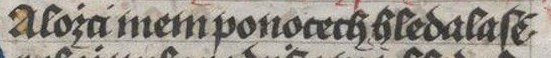Alożci mem ponocech hledala ſē.
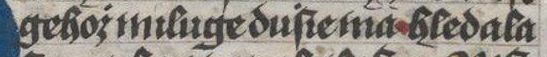gehoż miluge duẛíe má.hledala
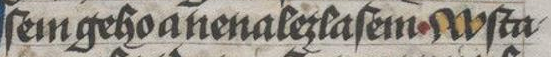ſem geho a nenalezlaſem.Wſta¬
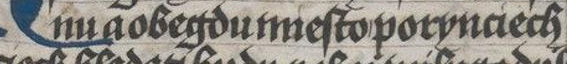nu a obegdu míeſto porynciech
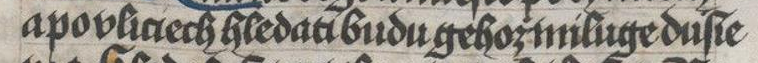a povliciech hledati budu gehoz miluge duẛie
